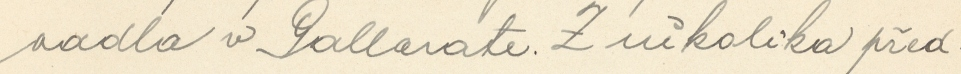vadla v Gallerate. Z několika před-
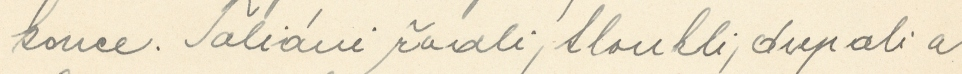konce. Taliáni řvali, tloukli, dupali a
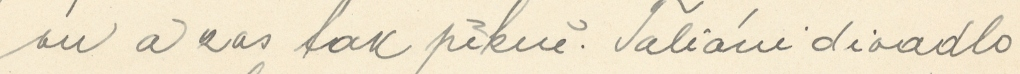vu a zas tak pěkně. Taliáni divadlo
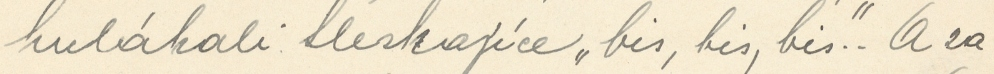hulákali tleskajíce „bis, bis, bis“. A za-
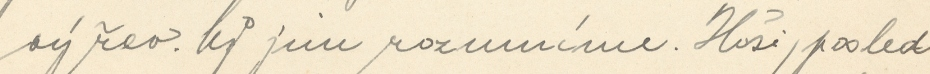vý řev. Už jim rozumíme. Hoši, posled-
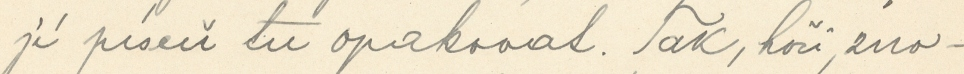jí píseň tu opakovat. Tak hoši, zno-
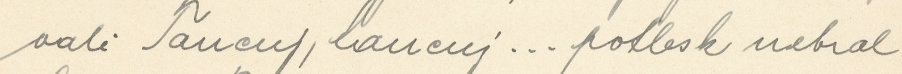vali Tancuj, tancuj... potlesk nebral
